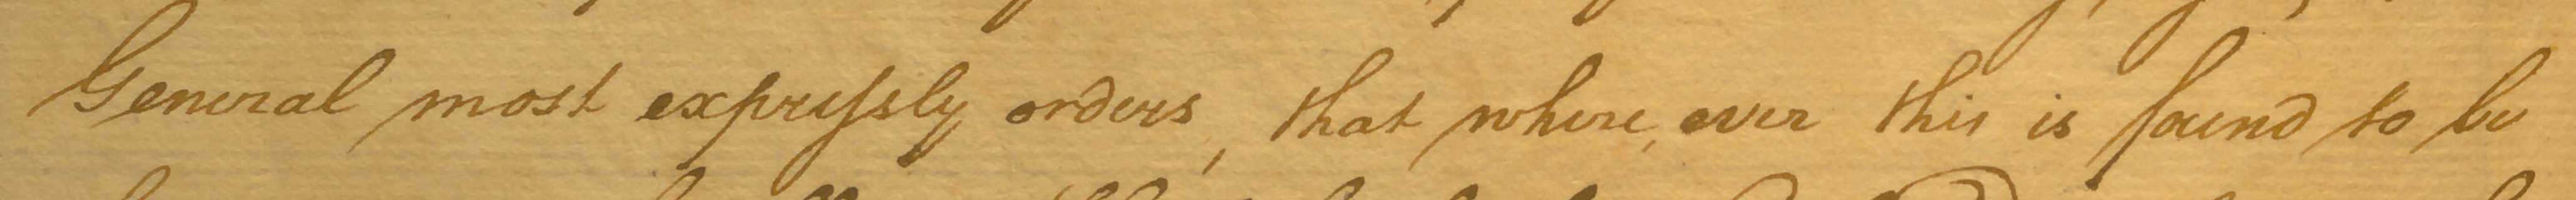General most expressly orders, that wherever this is found to be
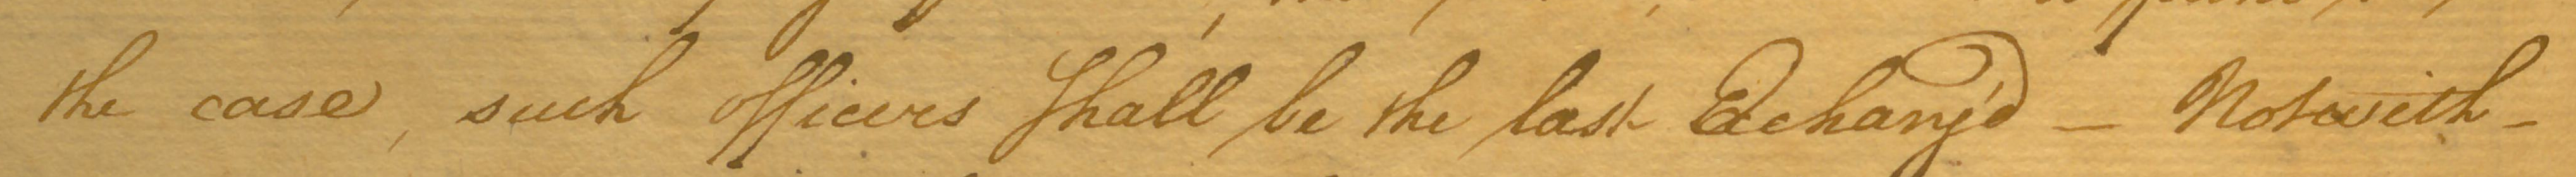the case such officers shall be the last Exchang'd- Notwith-
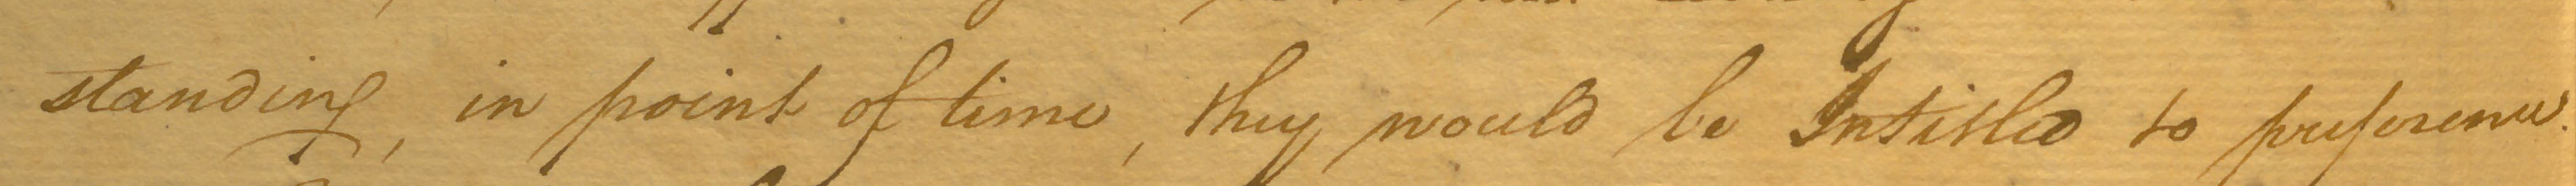standing, in point of time, they would be Intitled to preference.
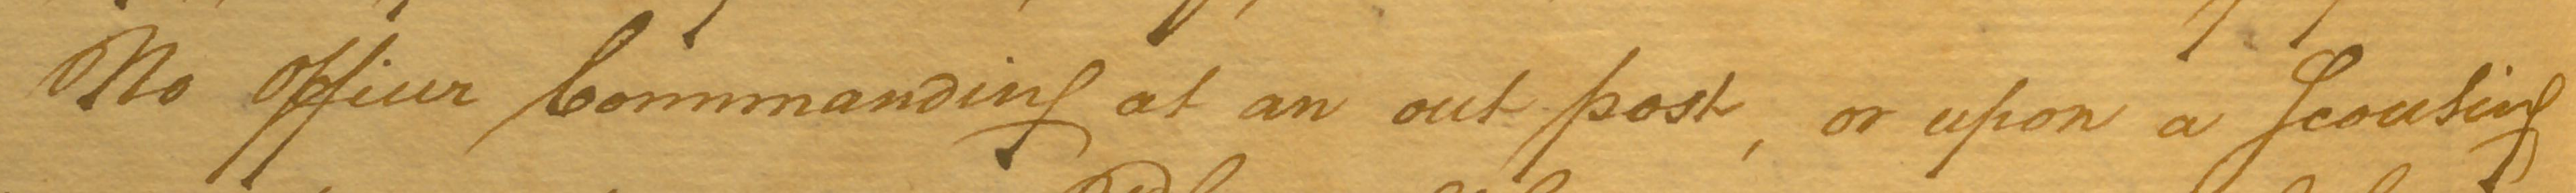No officer Commanding at an outpost, or upon a Scouting
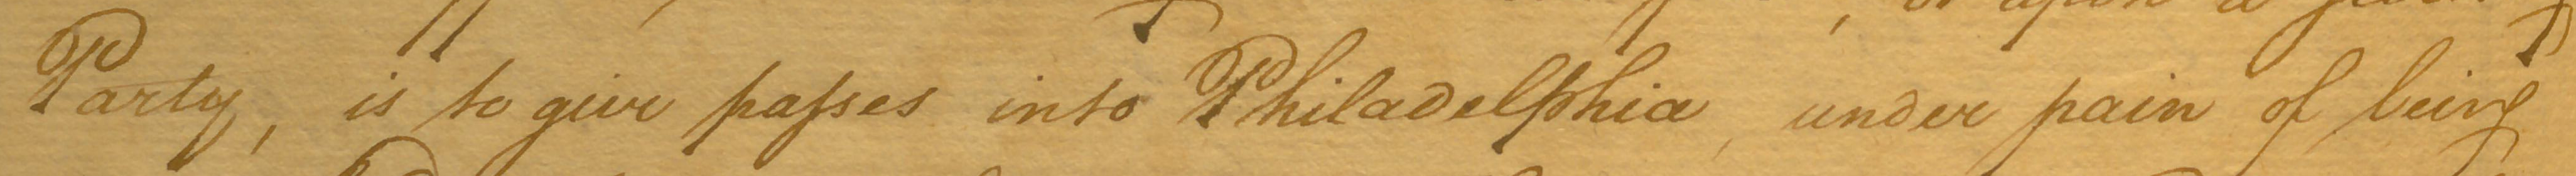Party, is to give passes into Philadelphia under pain of being
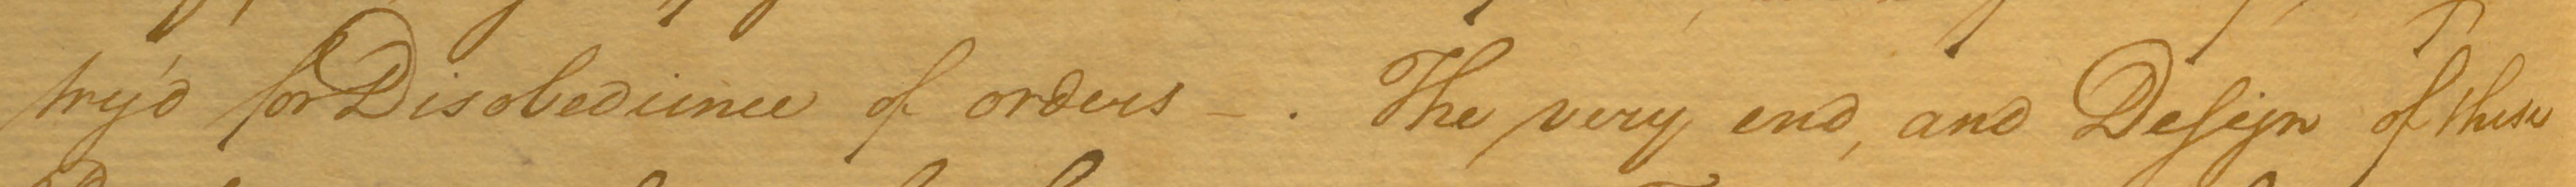try'd for Disobedience of orders. The very end, and Design of these
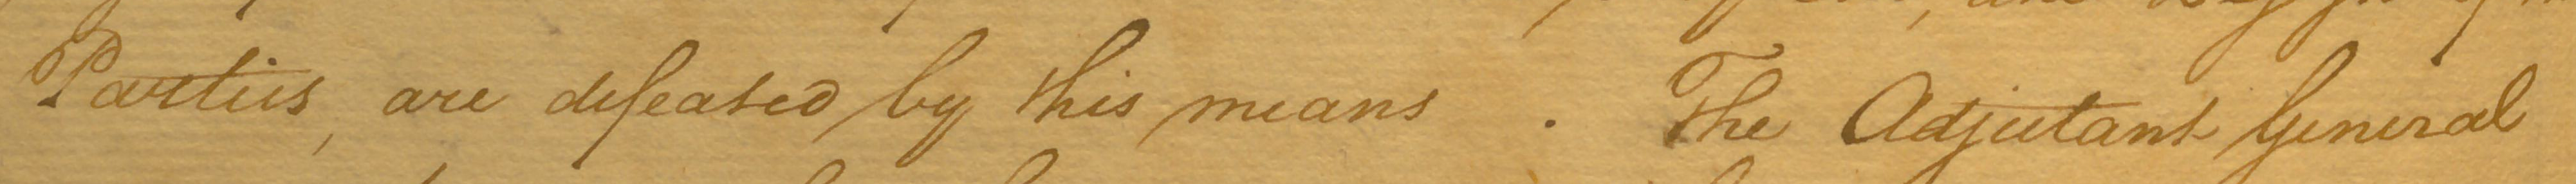Parties, are defeated by this means. The Adjutant General
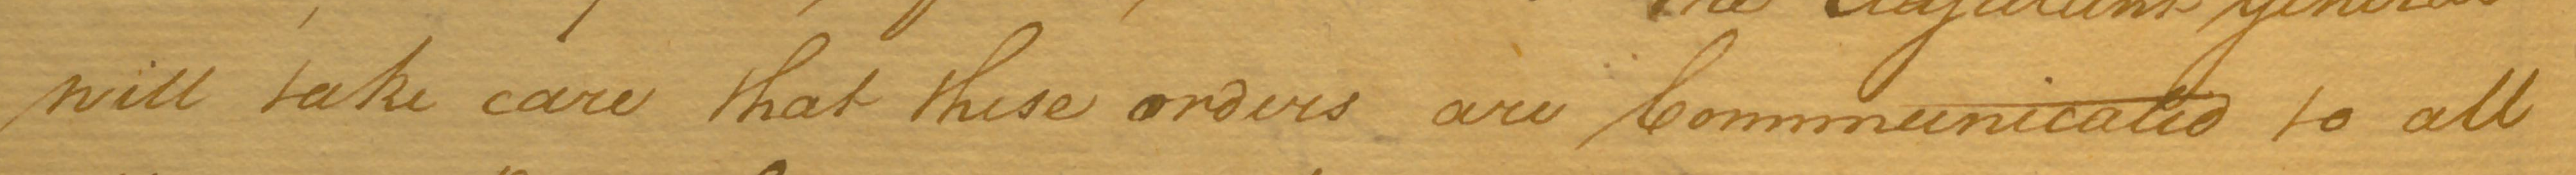will take care that these orders are Communicated to all
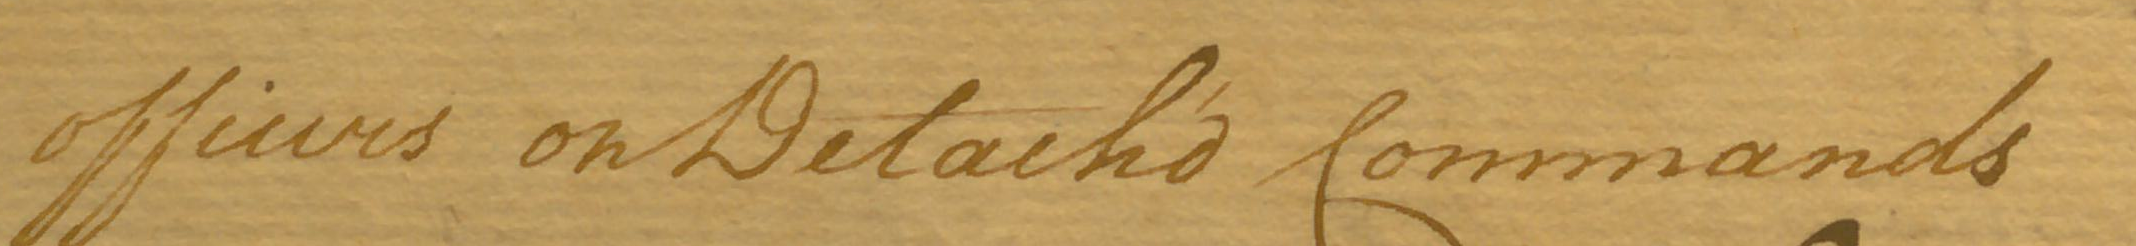officers on Detach'd commands
